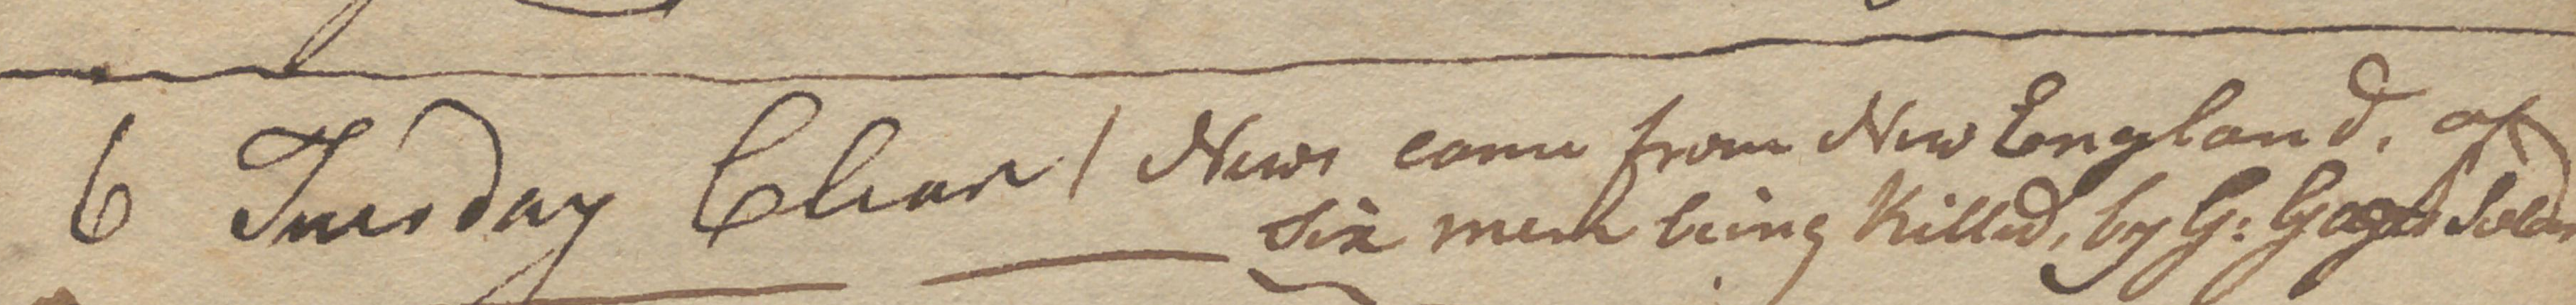6 Tuesday Clear / News came from New England, of
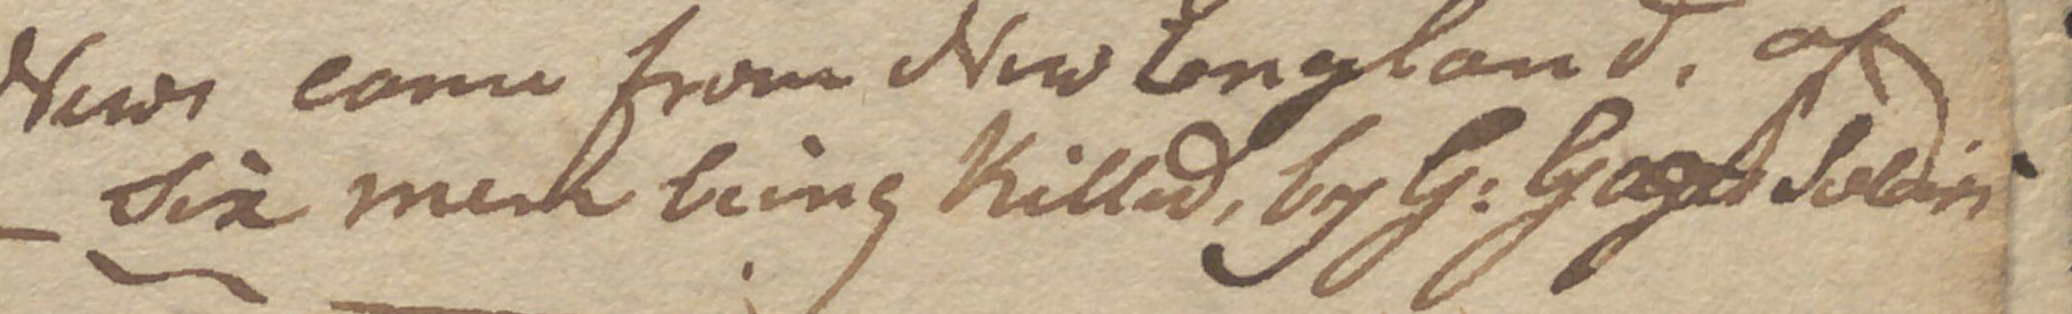six men being Killed. by G. Gages Soldiers
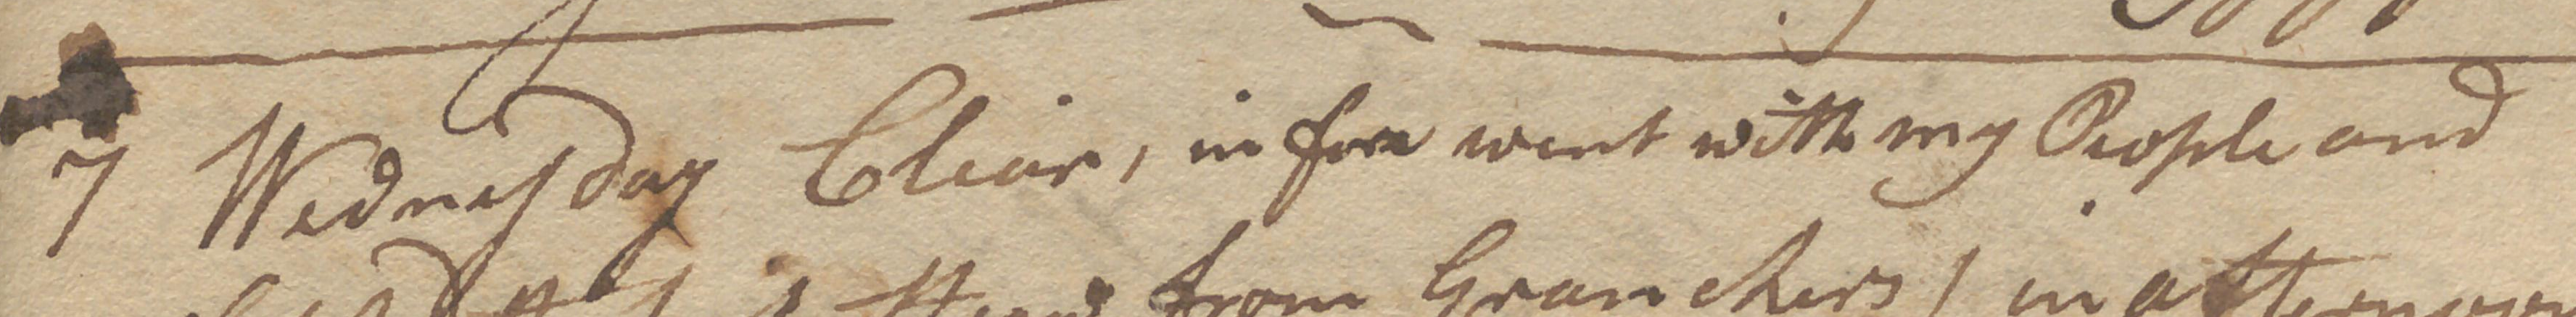7 Wednesday Clear, in fore went with my People and
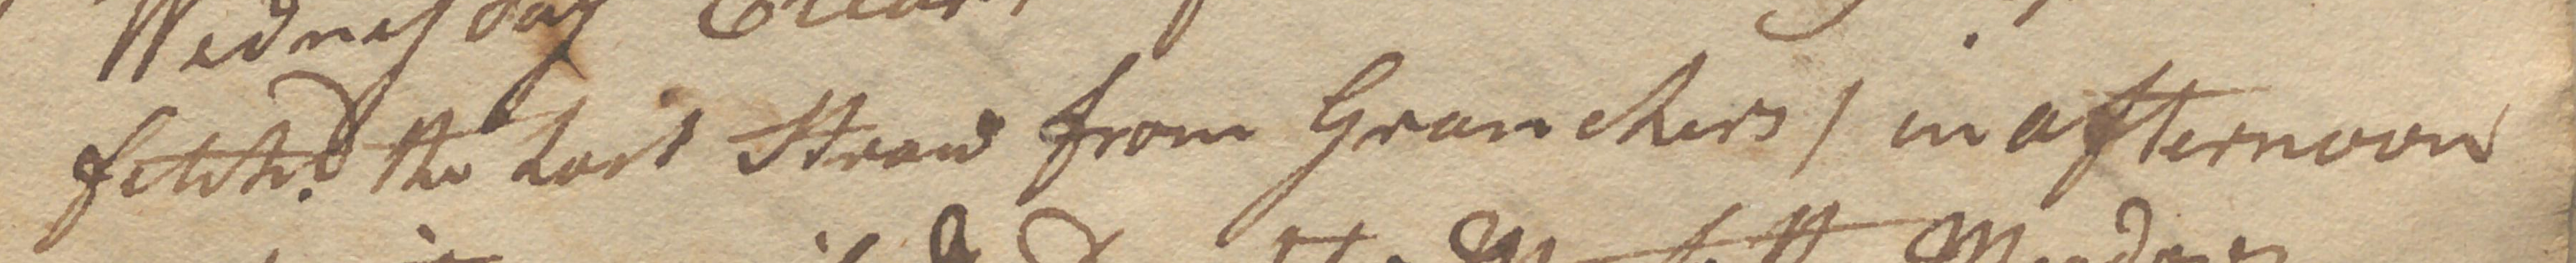fetch^d the Lart Straw from Granchers / in afternoon
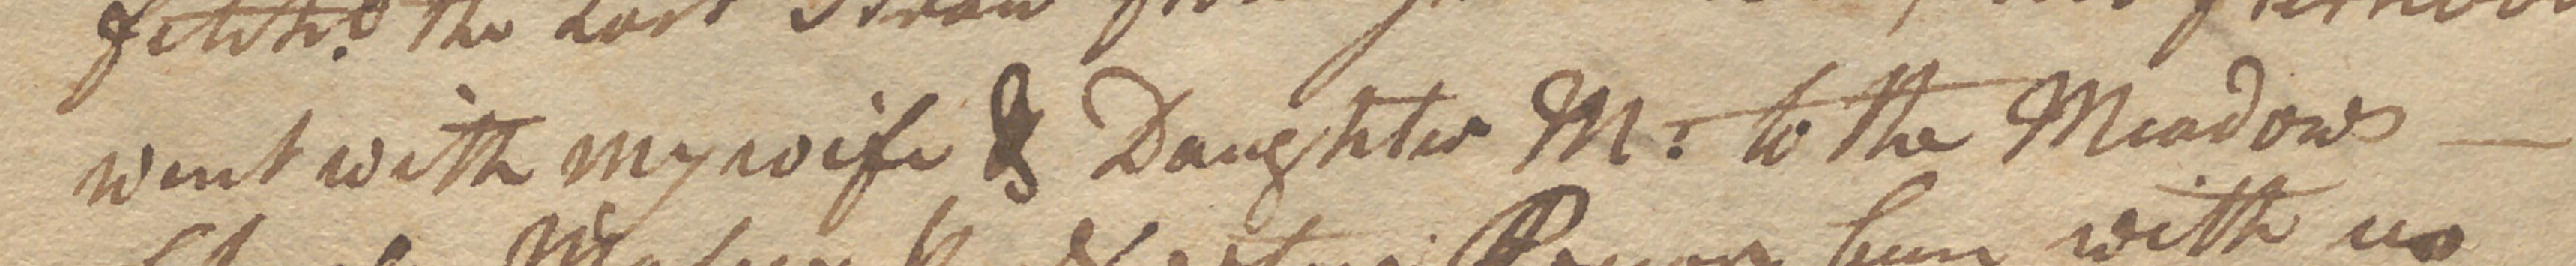went with my wife & Daughter M: to the Meadows
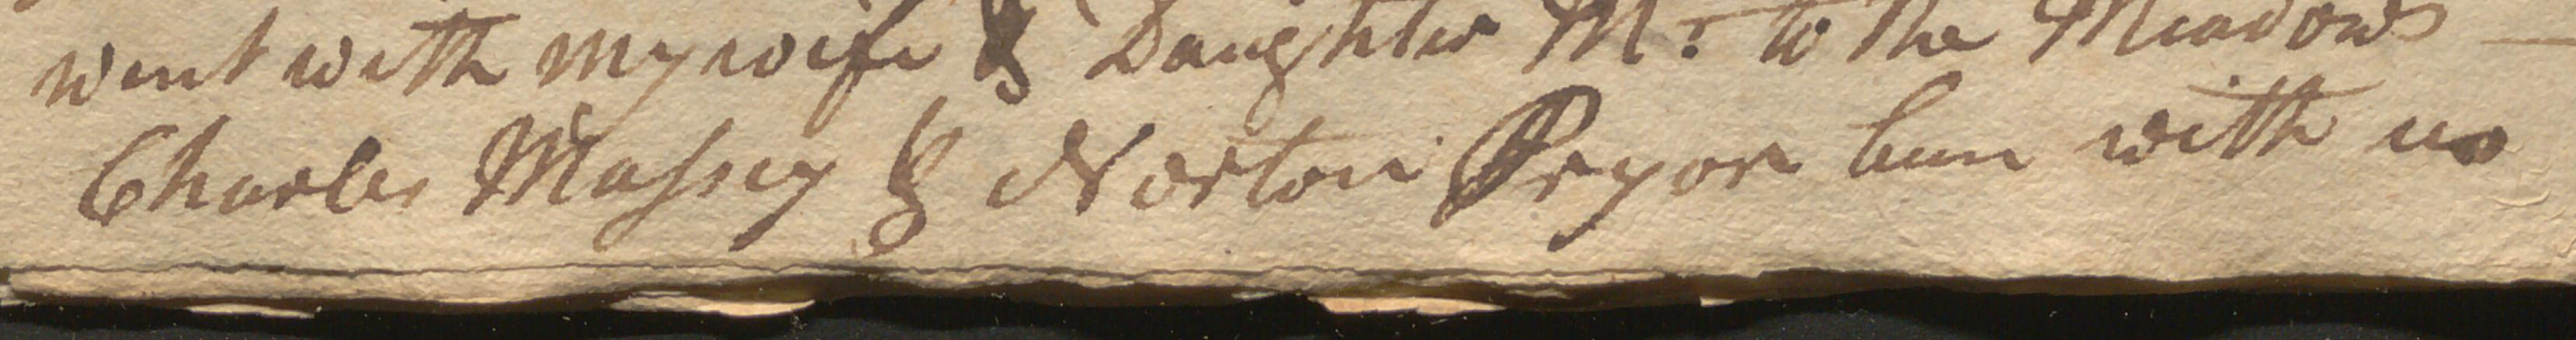Charles Massey & Noston Pryor been with us
